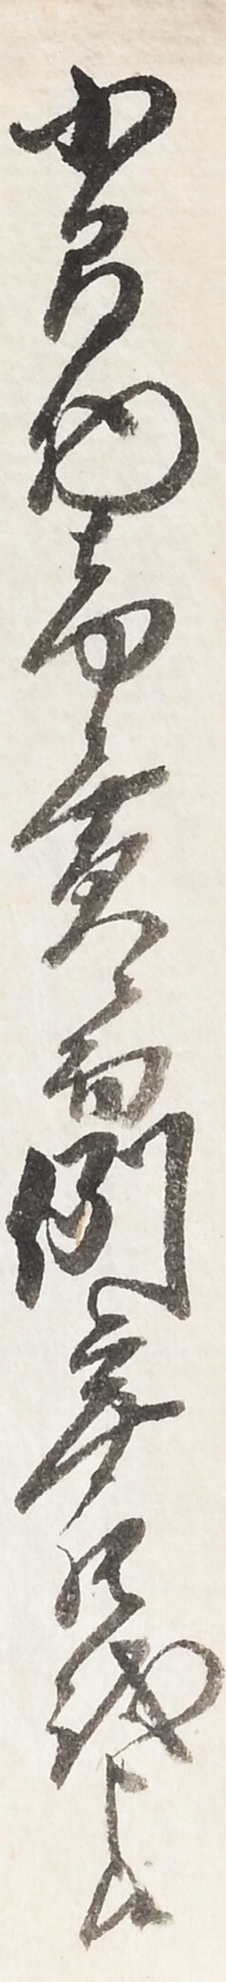小間物商売ニ而例年罷越申候
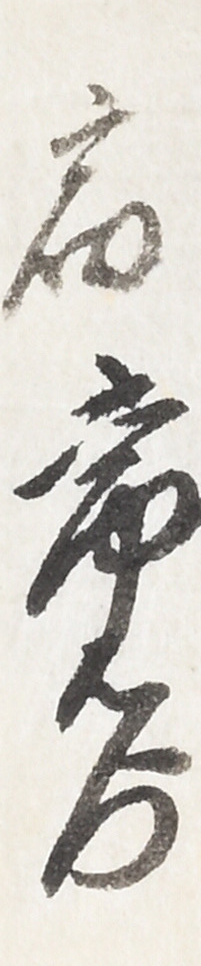宿常右衛門
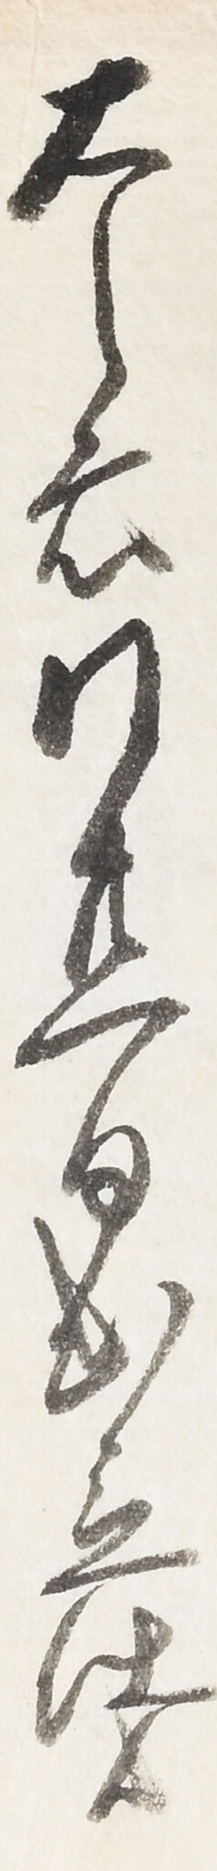右之者同廿一日出立仕候
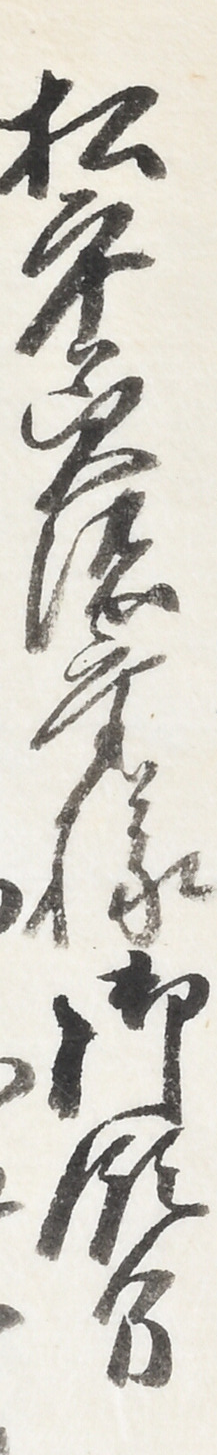松平美濃守様御領分
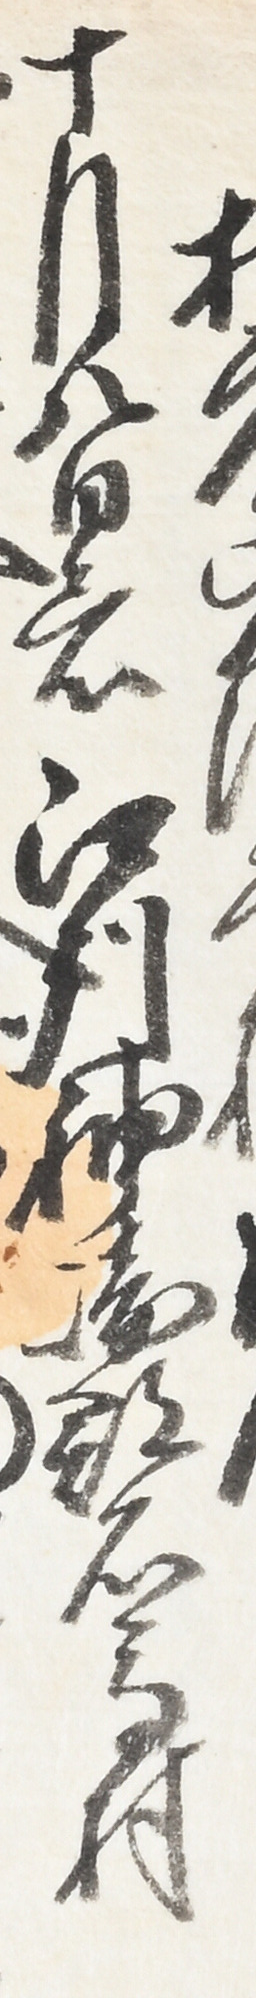十月八日着江州神崎郡石馬村
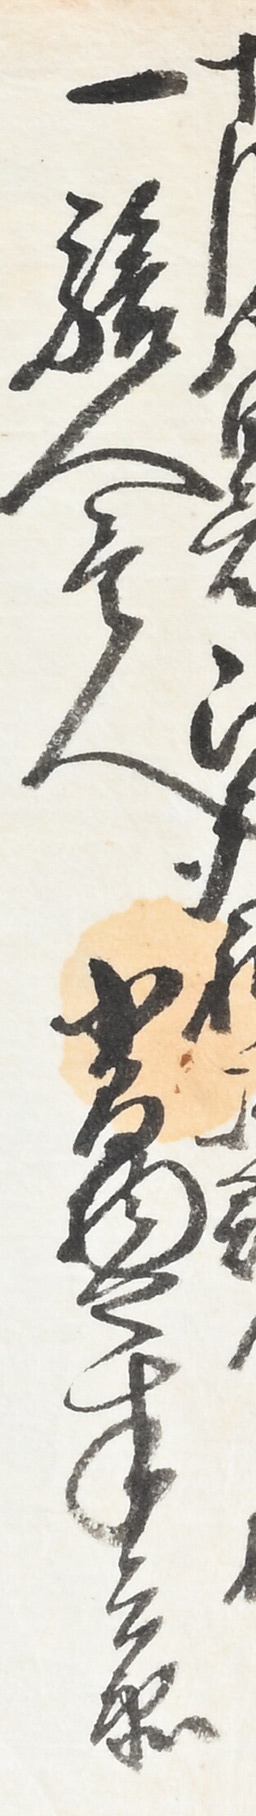一旅人壱人小間物や半兵衛
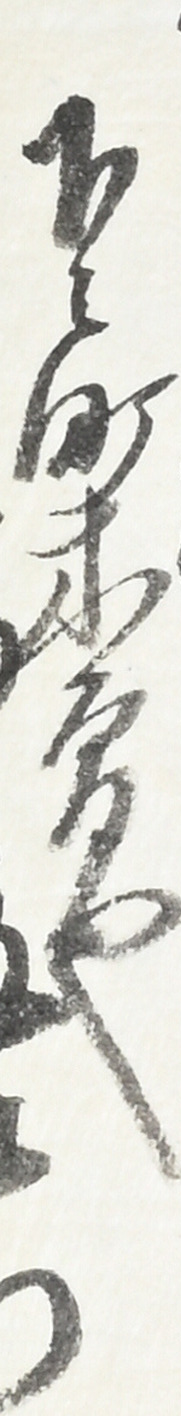下モ町木曽や
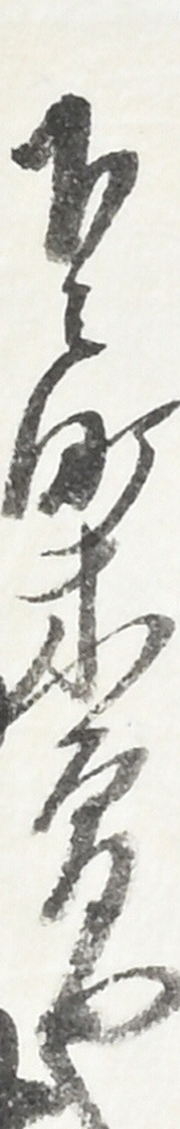下モ町木曽や
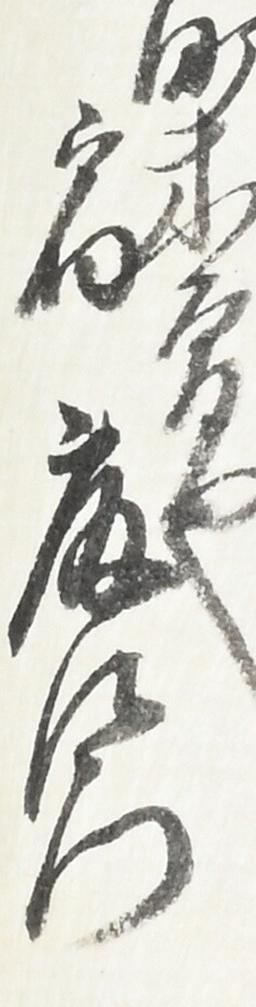宿藤左衛門
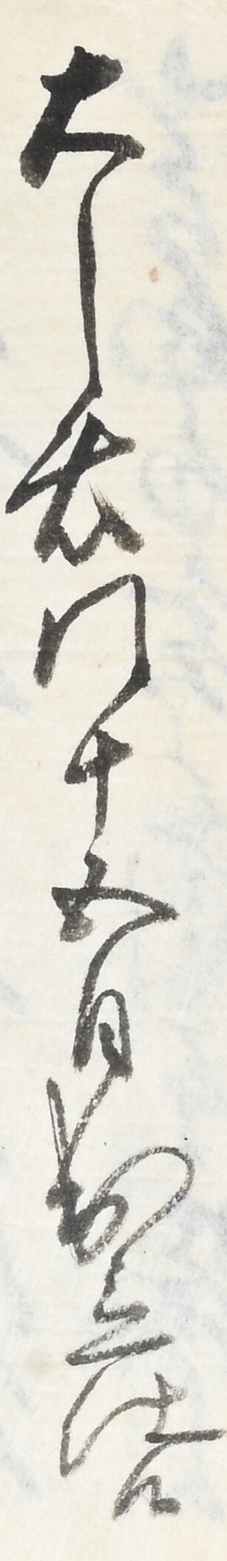右之者同廿一日出立仕候

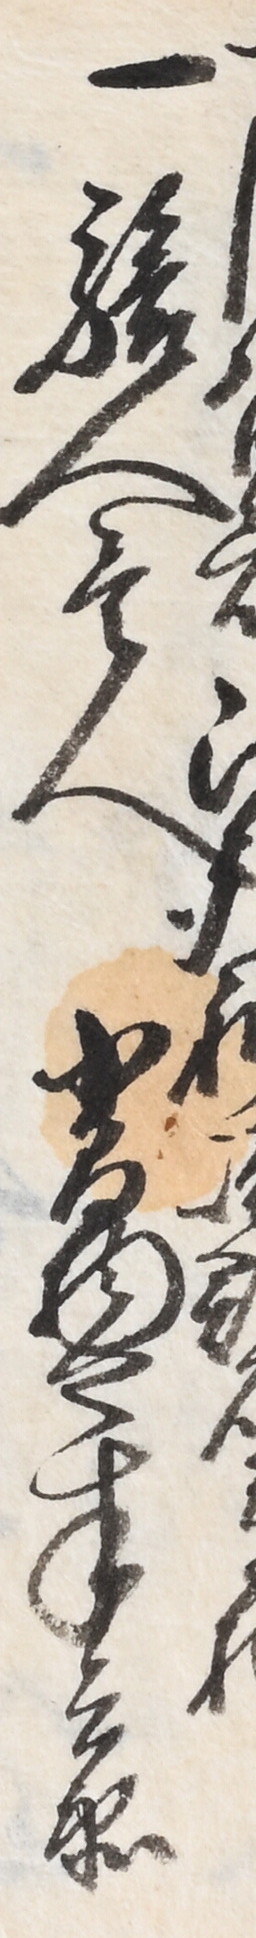一旅人壱人墨屋利兵衛
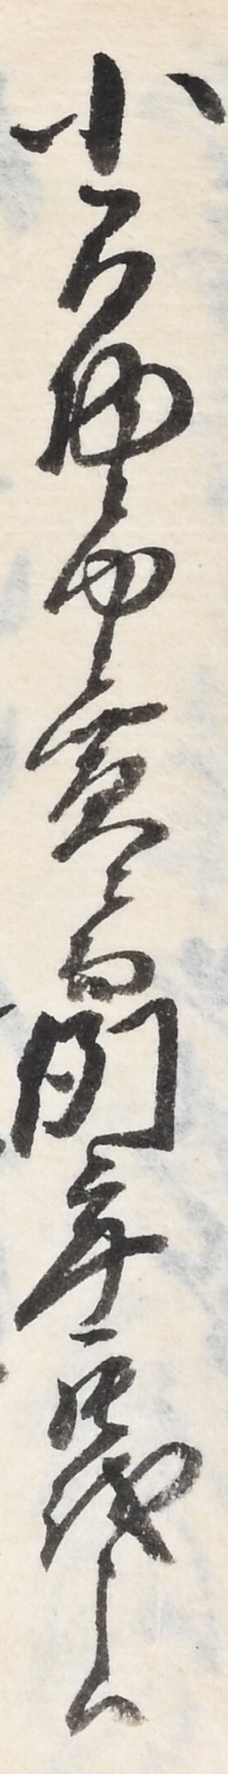小間物商売ニ而例年罷越申候
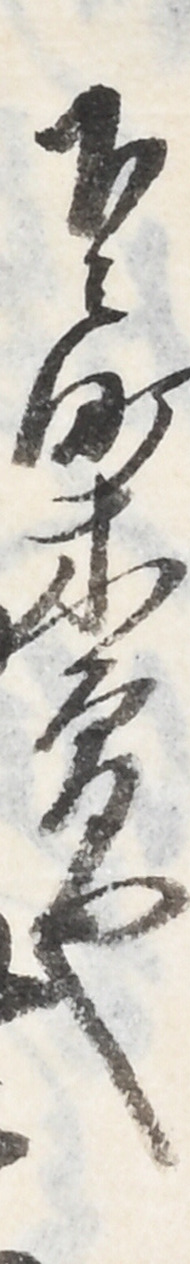下モ町木曽や
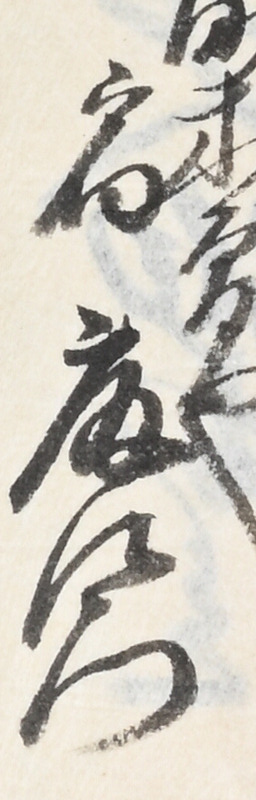宿籐左衛門
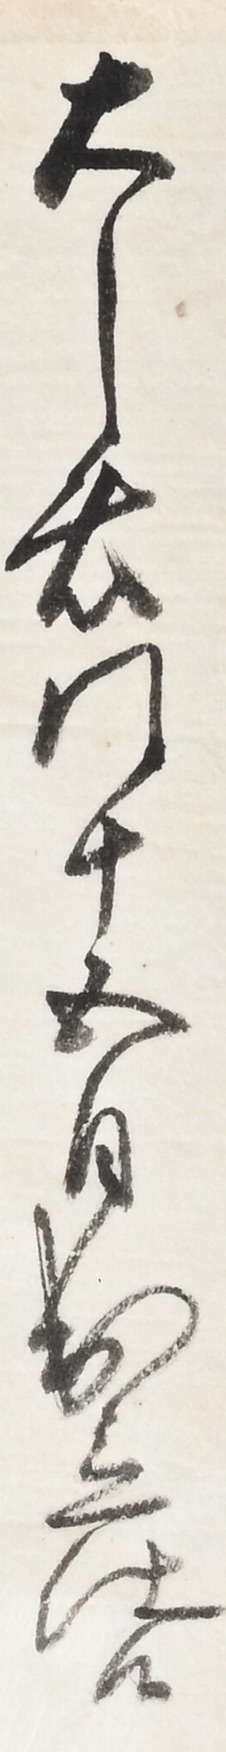右之者同十五日出立仕候
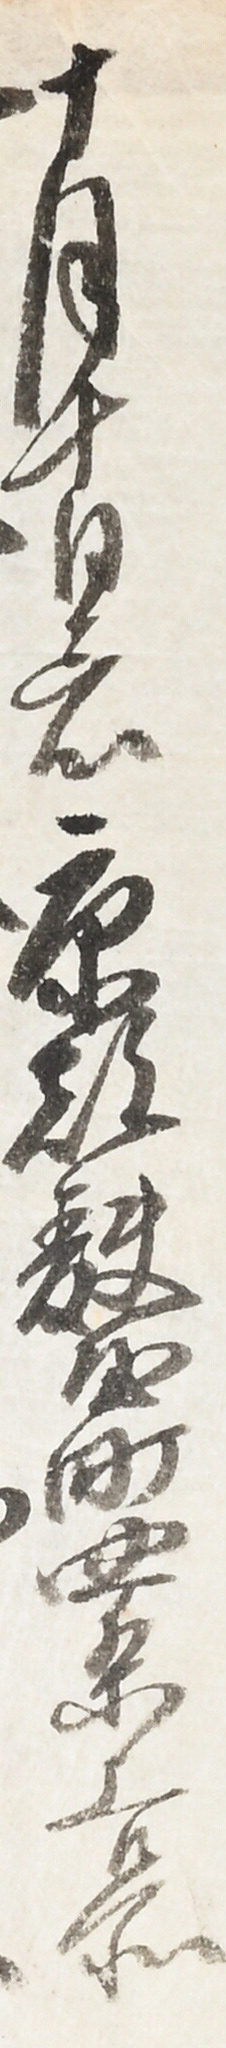十月十日着京都麩屋町四条上ル所
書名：旅人泊控帳
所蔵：伊那市立高遠町図書館・合同会社AMANE
